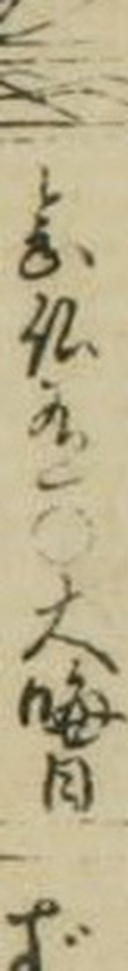念仏有○大晦日
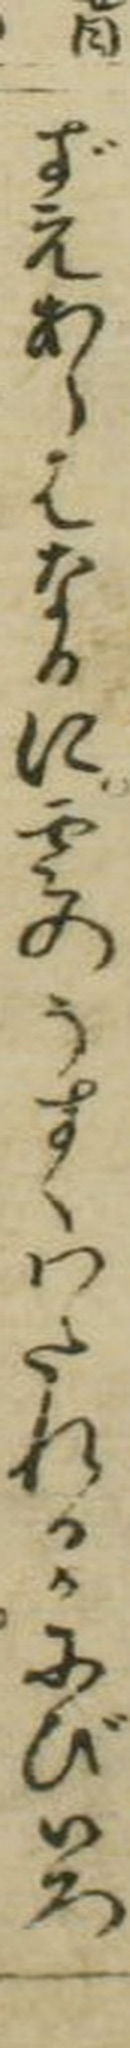ずえあらはなるに。雲のうすくわたれるかにびいろ
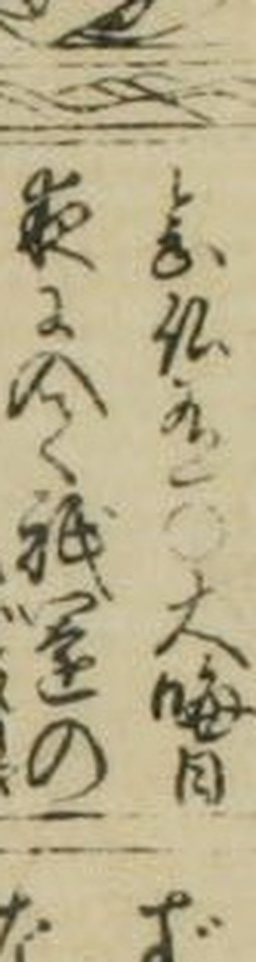夜に入て祇園の
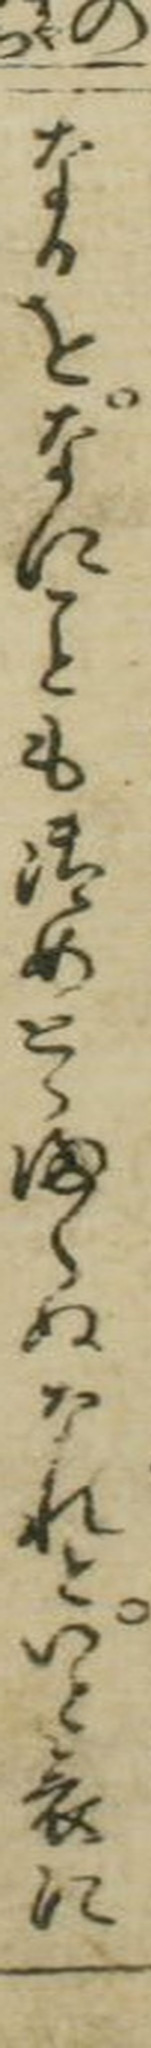なるを。なにことも御めとゝまらぬなれと。いと衣に
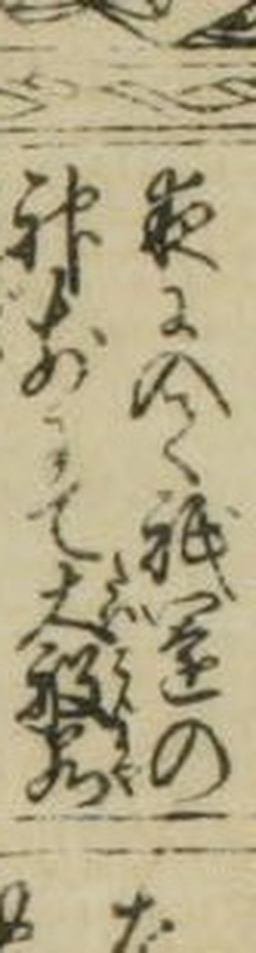神前にて大般若
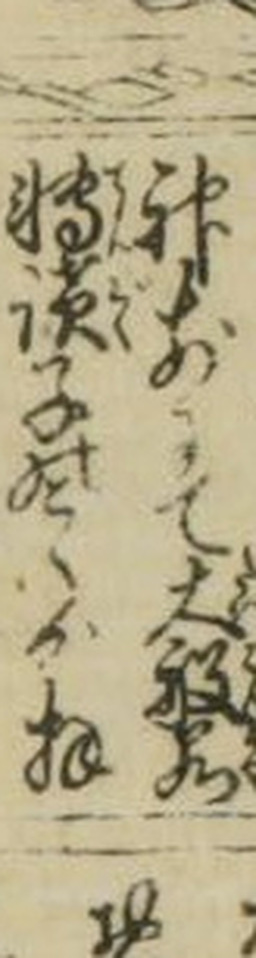転読子のこくより拝
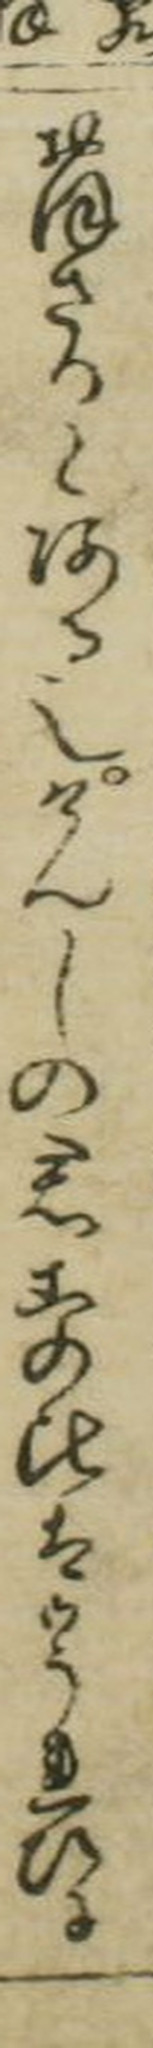おほさるとある也。けんしの君この比は御うれひに
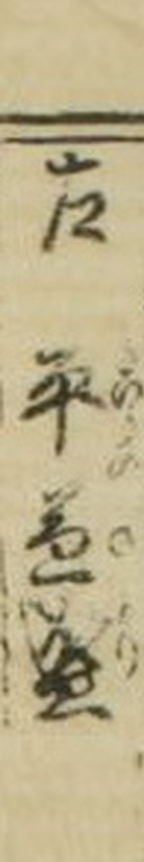左平兼盛
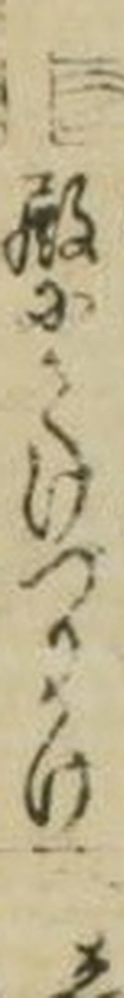殿にてけづりかけ
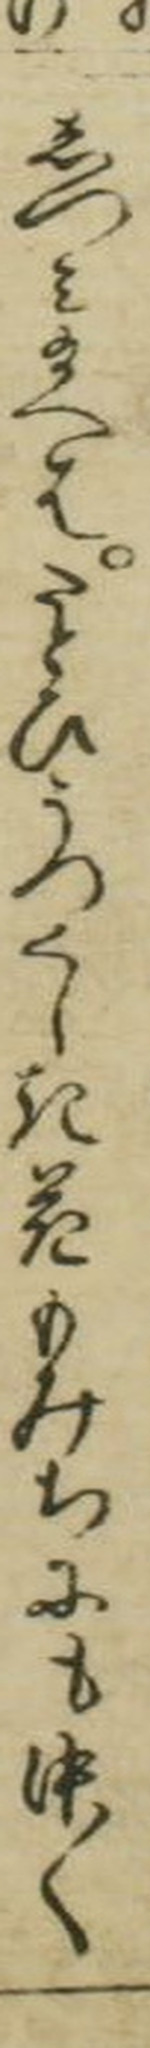しつみ給へは。たとひうつくしき花もみちにも中〳〵
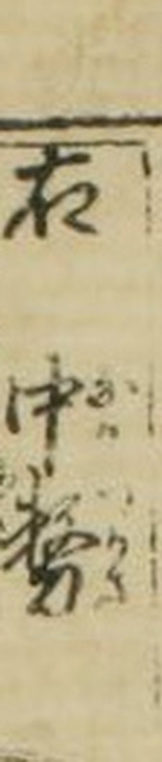右中務
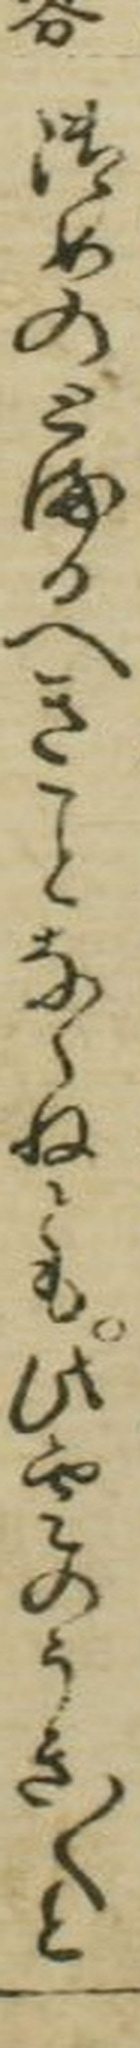御めのとまるへきことならねとも。此雲のうき〳〵と
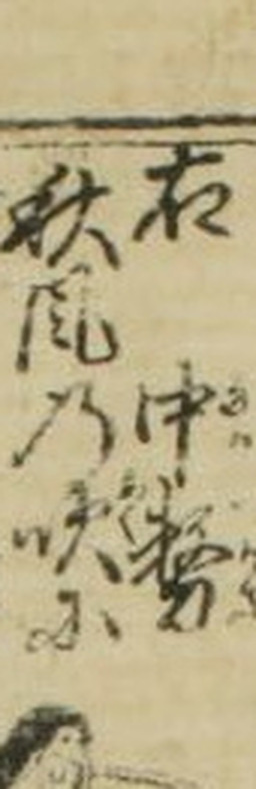秋風の吹に
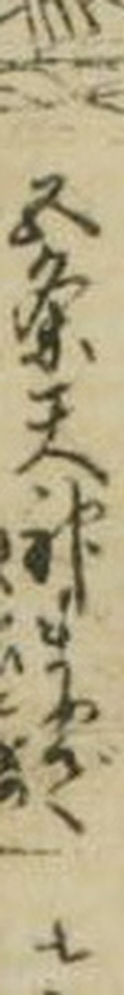五条天神まふで
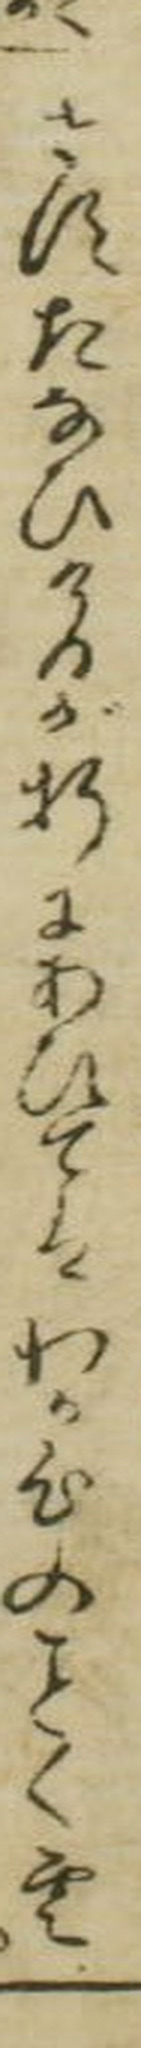さすたなひけるが折にあひてはわか心のことく雲
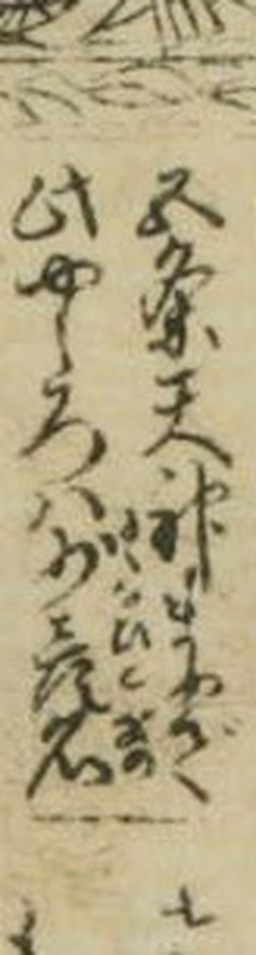此やしろは少彦名
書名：女源氏教訓鑑
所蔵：東京学芸大学附属図書館
